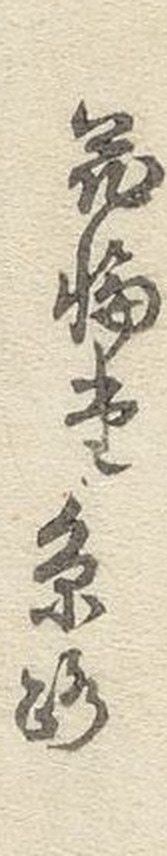花輪堂糸路
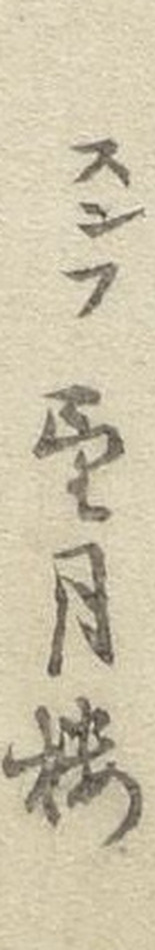スンフ望月楼
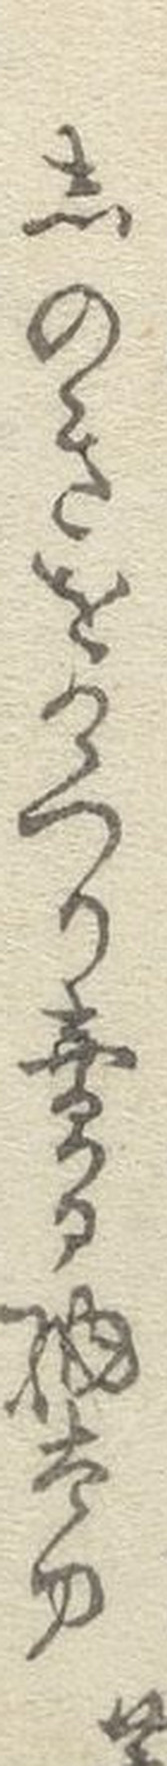しのきをけつりうる納太刀芦丸
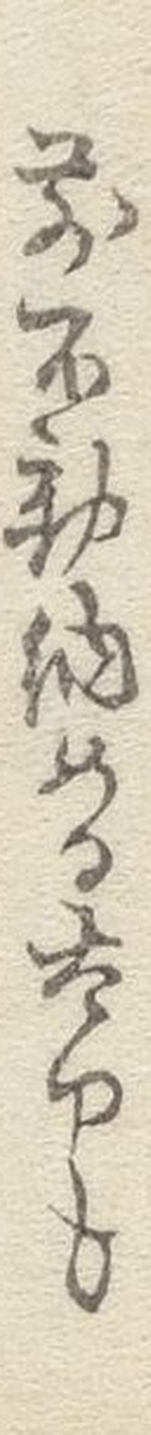前不動納める太刀も
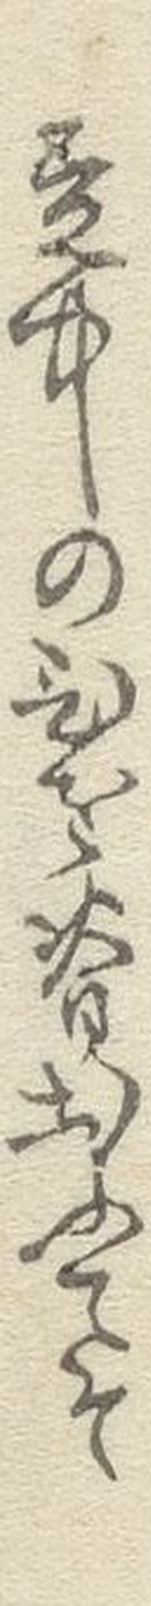昼中のひを背おふてそ
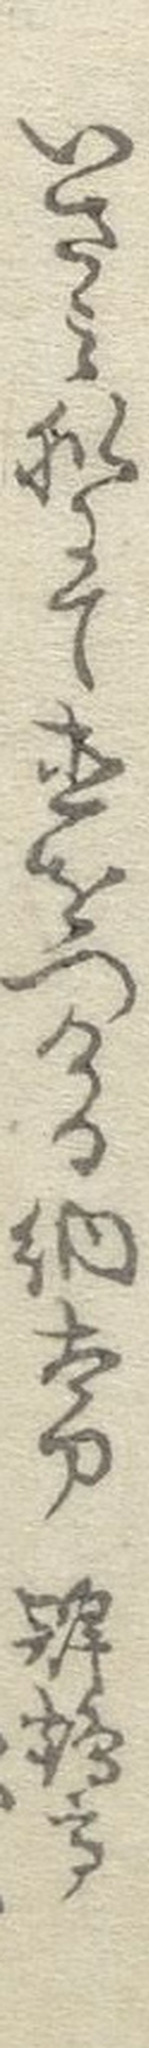いさみ船にて直をつける納太刀鴇鶴亭
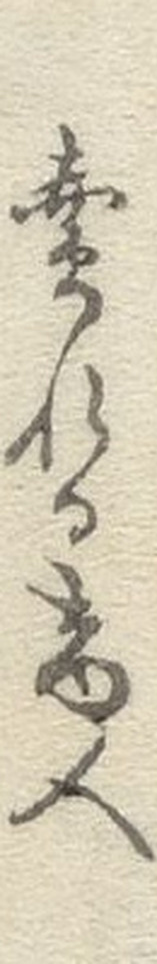売れる商人
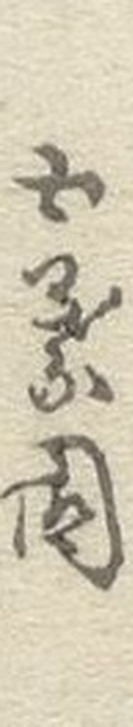五葉園
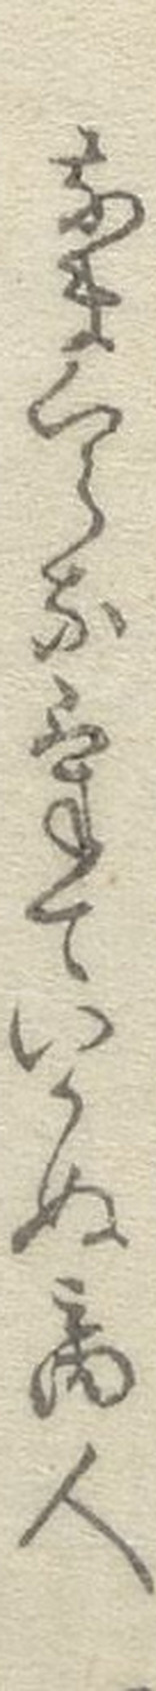なまくらなけていかぬ商人美鳥
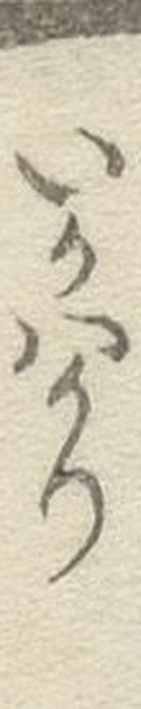いかはかり
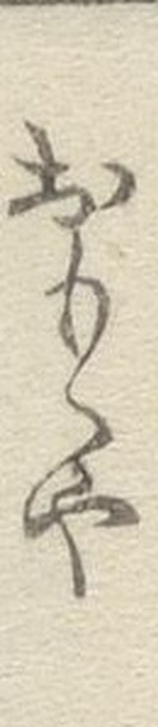おもくや
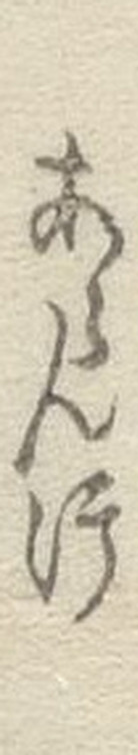あらん片
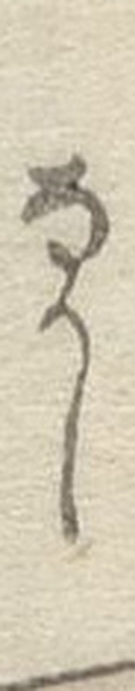なかし
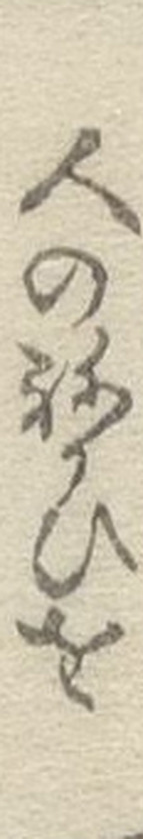人のねかひを
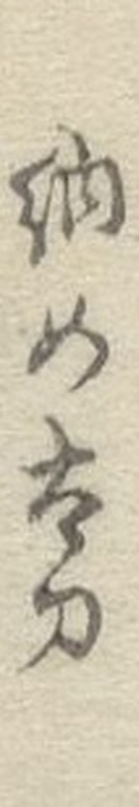納め太刀

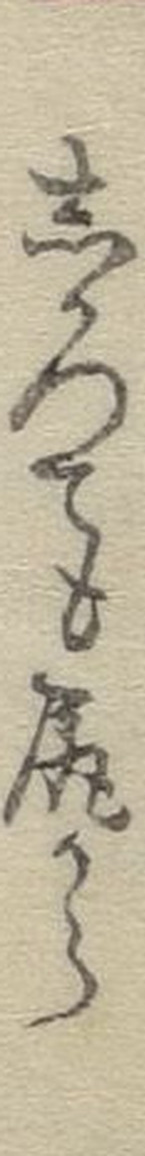しかつても尻から
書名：Picture Album of People with Kyōka (Light Verse) (Kyōka shiki jinbutsu 狂歌四季人物)
